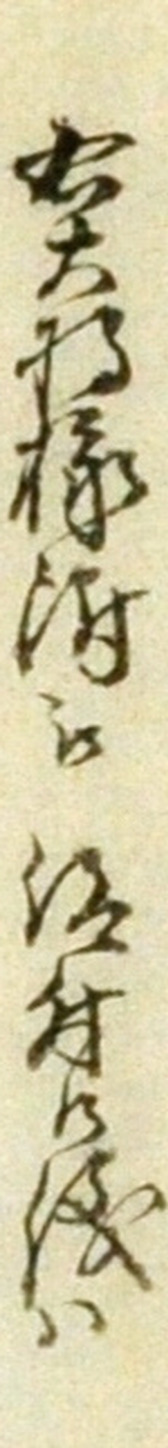右大将様附被仰付候儀ハ
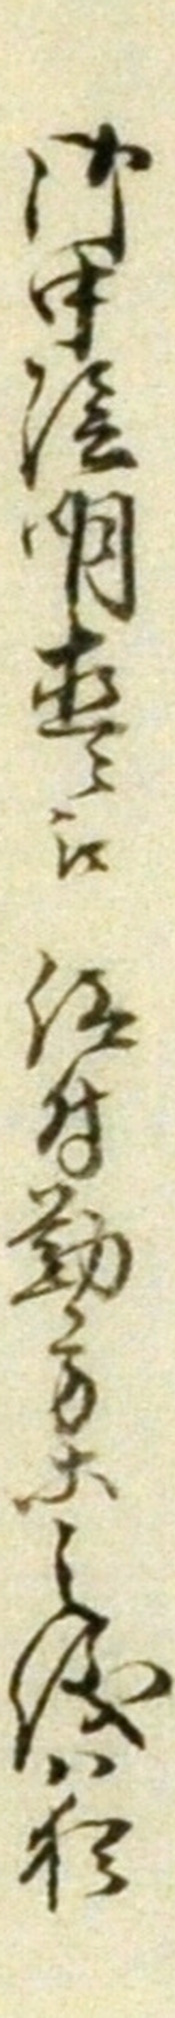御中陰明直ニ被仰付勤方等之儀ハ猶
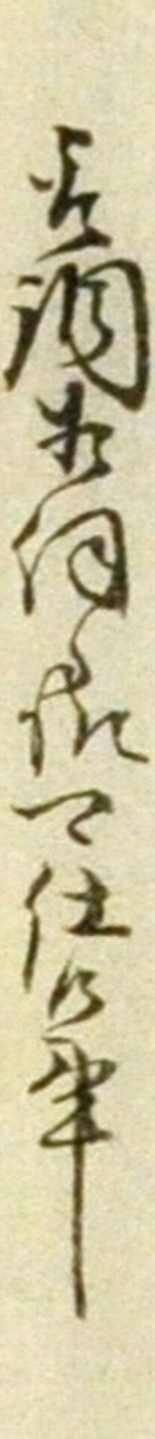取調相伺候様可仕候事
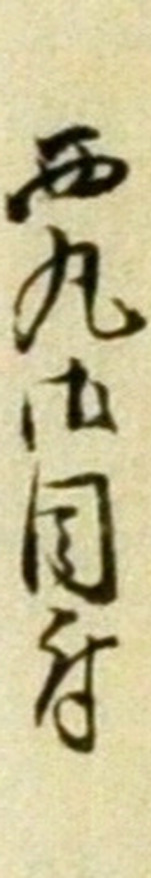西丸御目付
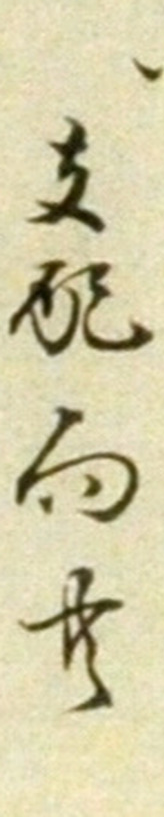支配向共
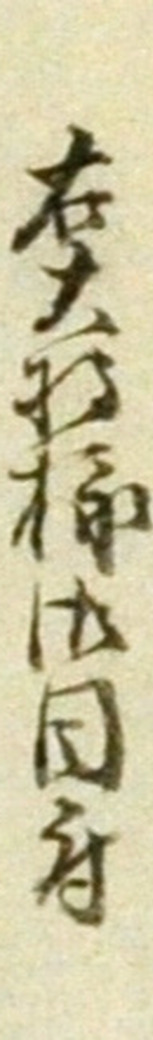右大将様御目付
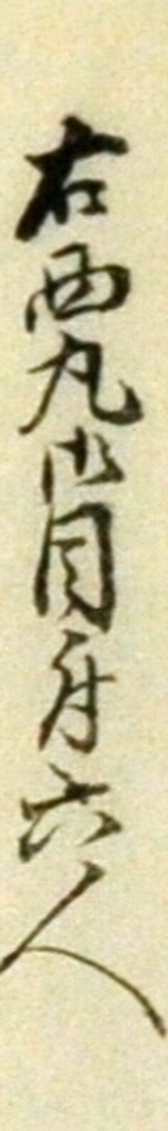右西丸御目付六人
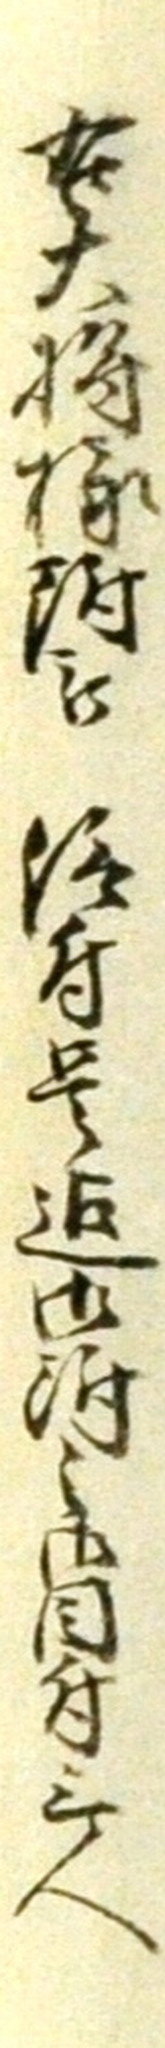右大将様附被仰付是迄御附之御目付三人

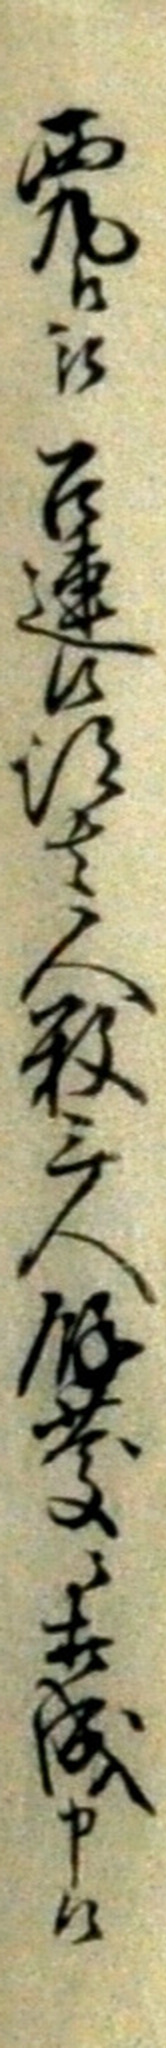西丸江被召連候得者人数三人餘慶ニ相成申候
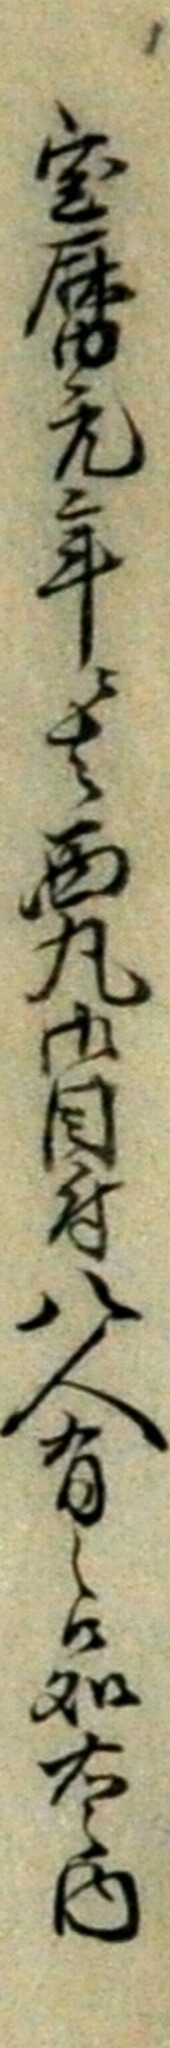宝暦元年ニ者西丸御目付八人有之候処右之内
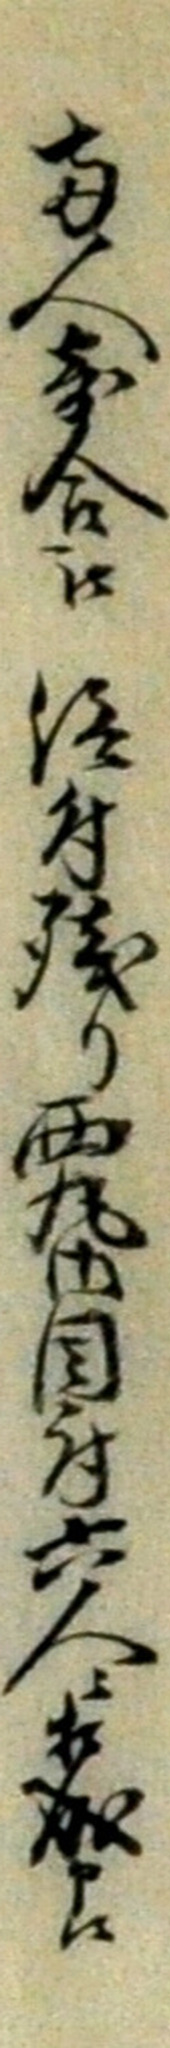両人寄合被仰付残り西丸御目付六人ニ相成申候
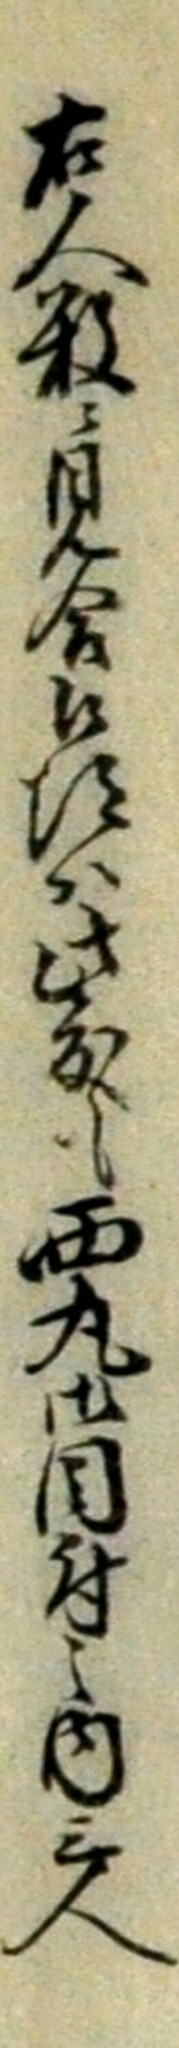右人数ニ見合候得ハ此度も西丸御目付之内三人
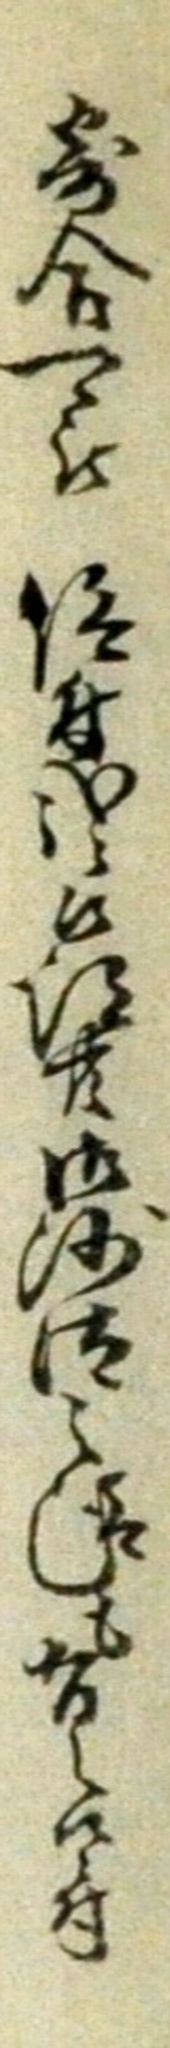寄合可被仰付哉ニ候得共御沙汰之趣も有之候ニ付
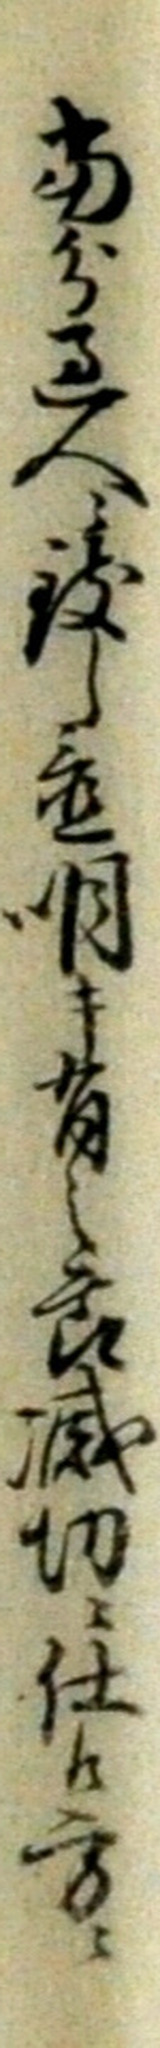当分過人ニ致し置明キ有之節滅切ニ仕候方ニ
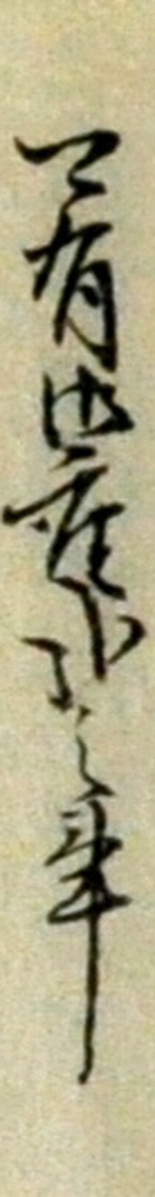可有御座哉之事
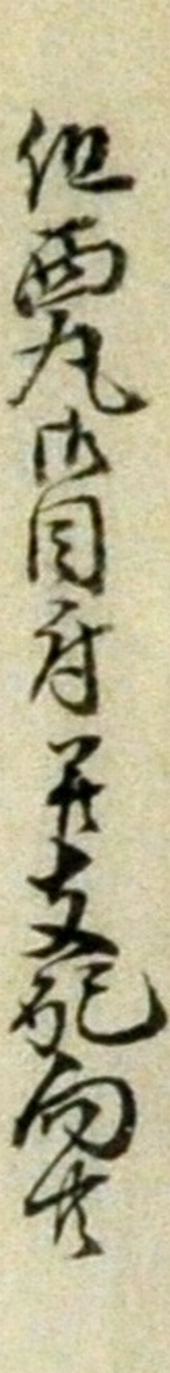但西丸御目付幷支配向共
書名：若年寄御役中御調書付
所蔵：伊那市立高遠町図書館・合同会社AMANE
